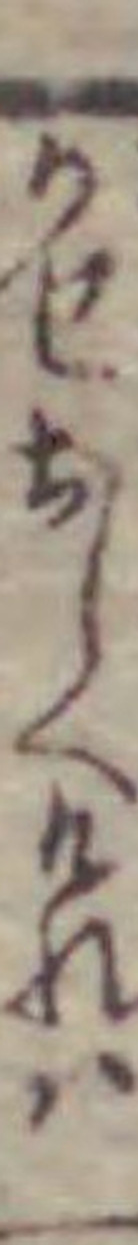かせおしへけれは
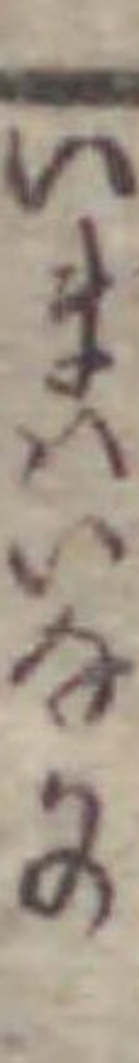いまはなかの
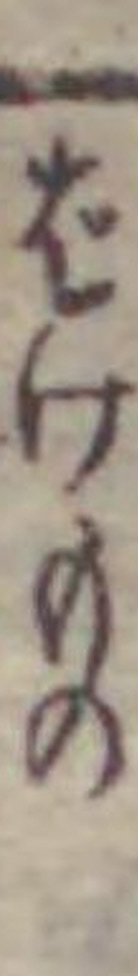ばけもの
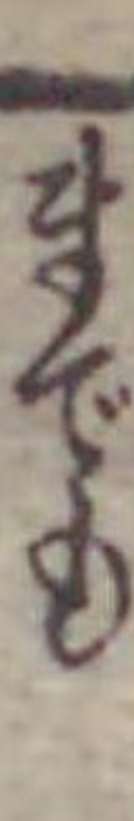までも
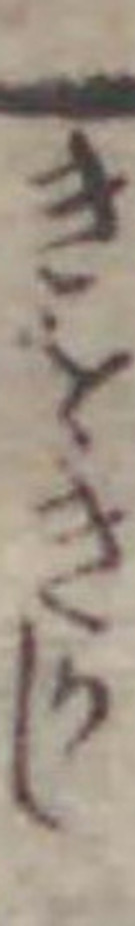きをきかし
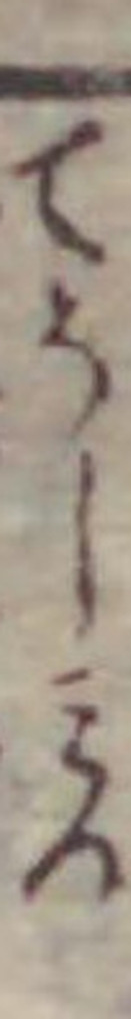てうしみつ
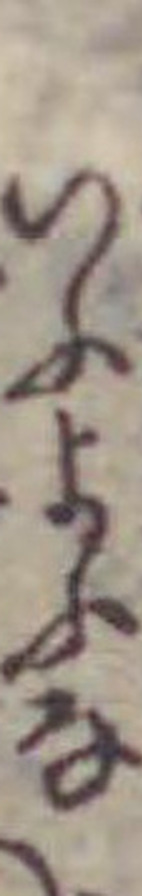いふよふな
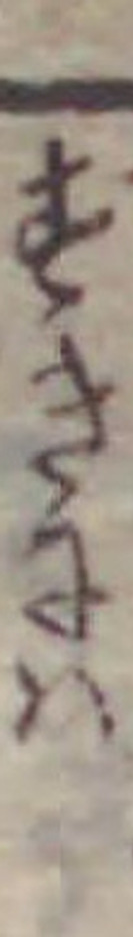すきには
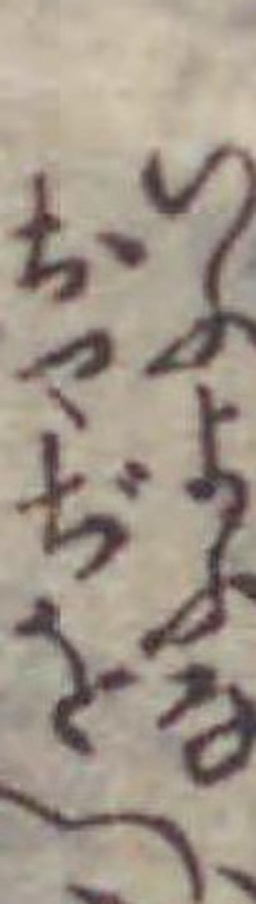おやぢを
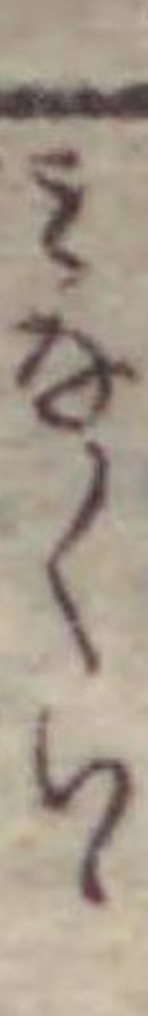みな〳〵いゝ
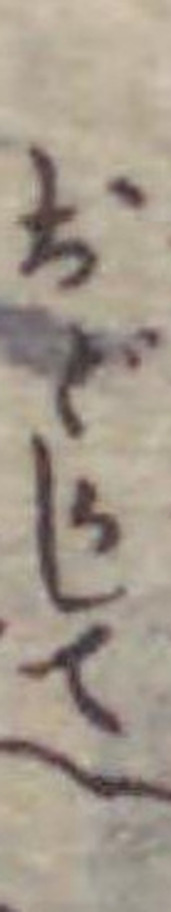おどかして
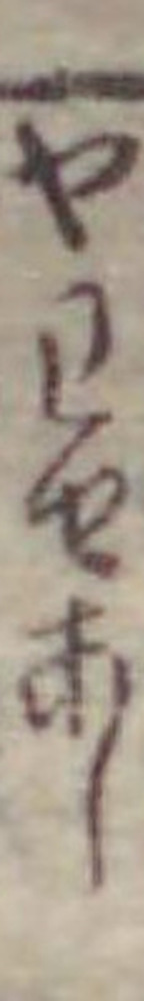やわせあし
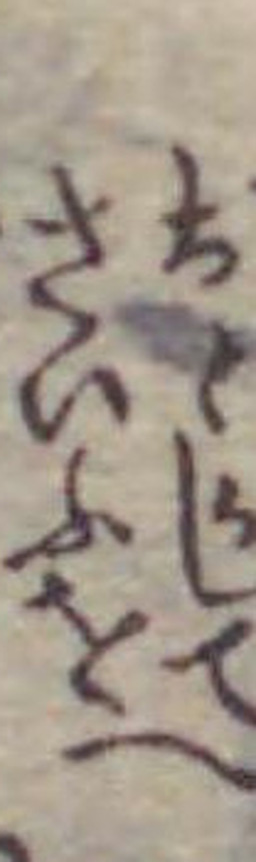さいふを
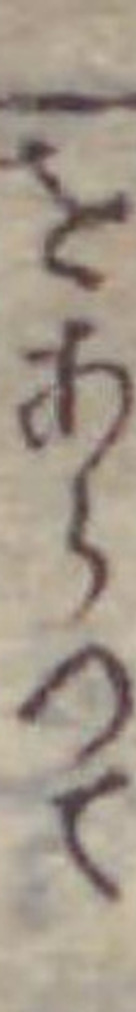をあらつて
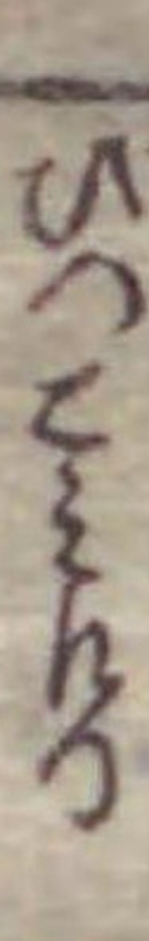ひつこみけり
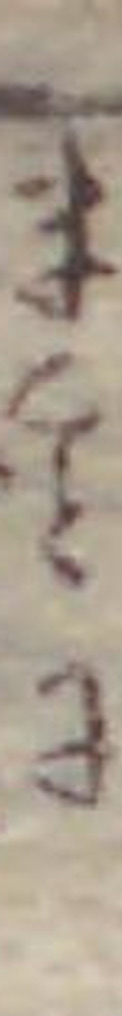まことに
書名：化物見世開 : 2巻
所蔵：国立国会図書館 National Diet Library, JAPAN
